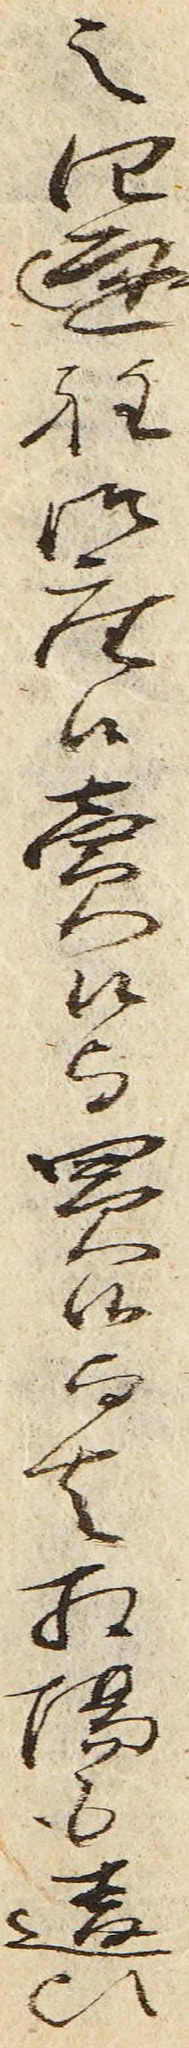之四通程御座候売候と買候とは相場も違ひ

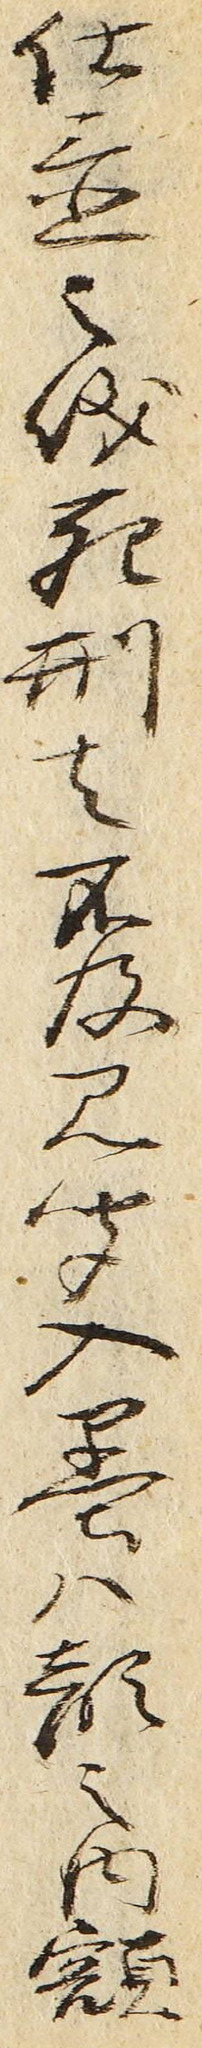仕置之儀死刑は不及見聞入墨は顔之内額
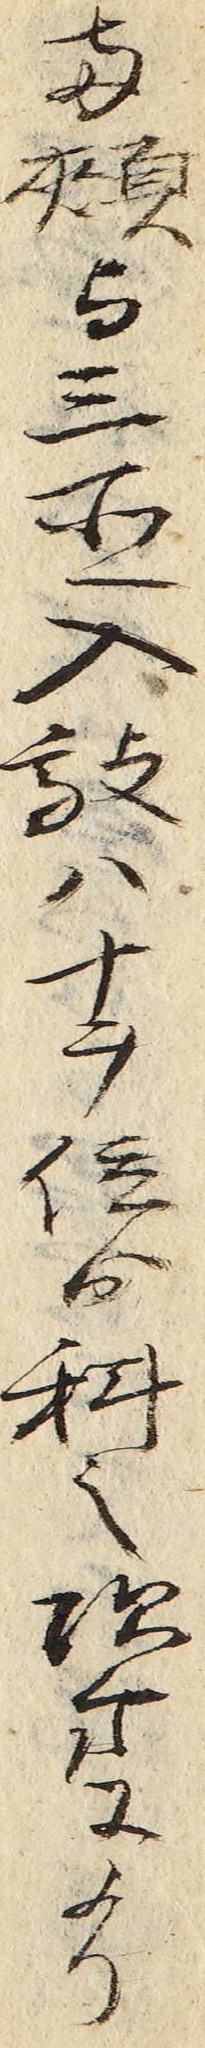両頬と三所へ入敲は十ヲ位ゟ科之次第により
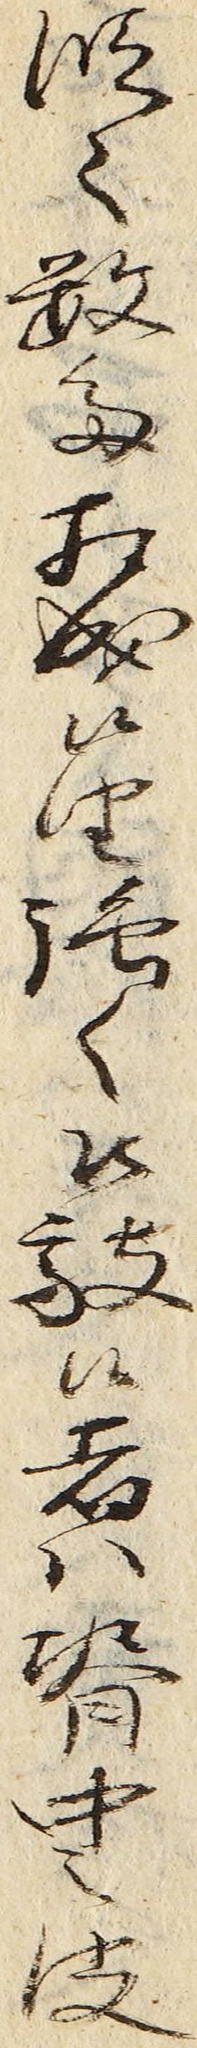段々数多相成候由強く被敲候者は背中之皮
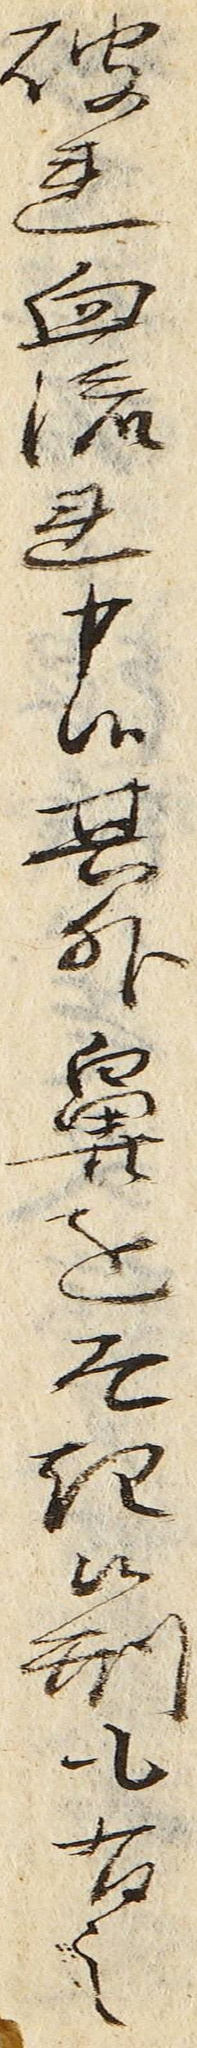破れ血流れ申候其外鼻をそき候刑も有之
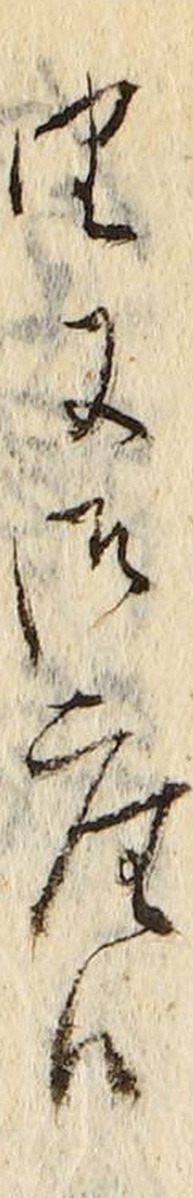由に御座候
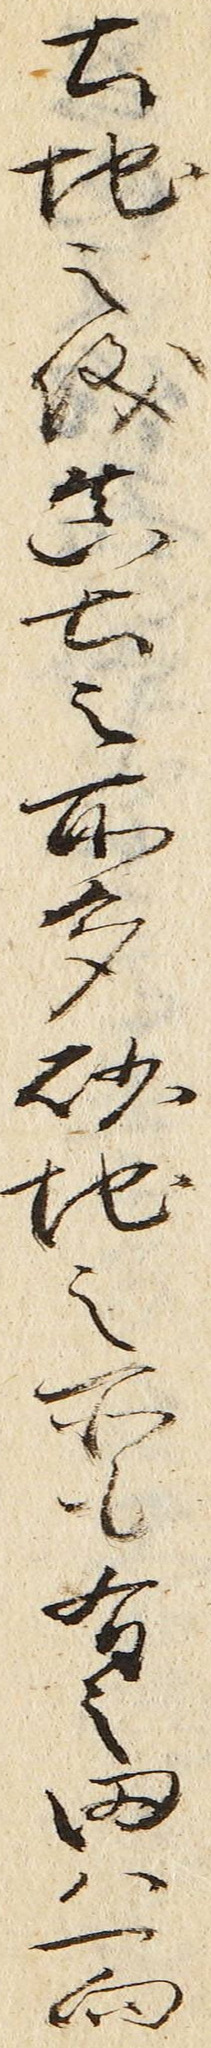土地之儀真土之所多砂地之所も有之田は一向
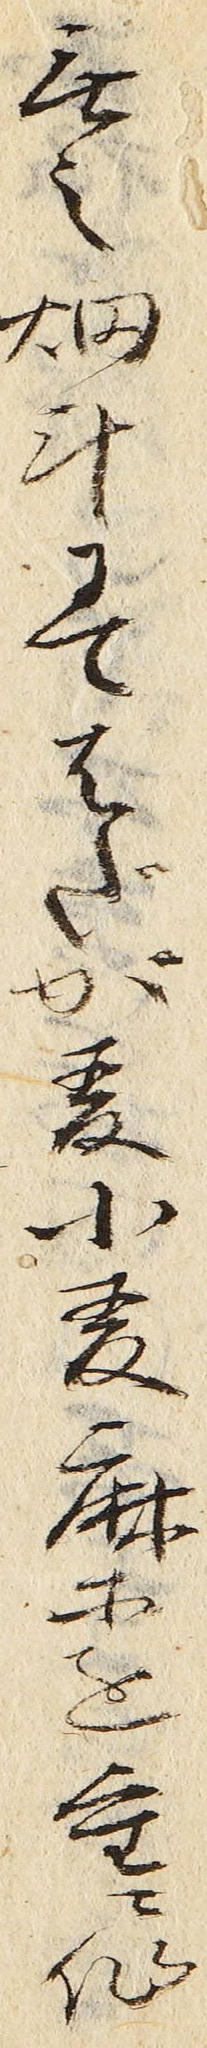無之畑斗にてはだが麦小麦麻等を重に作
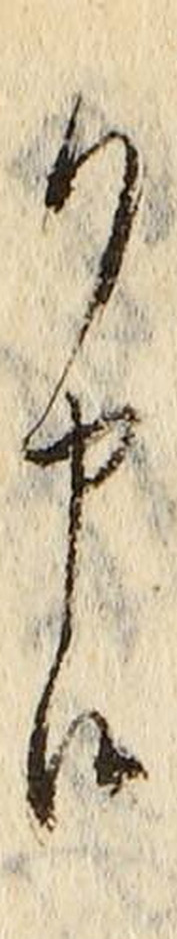り申候
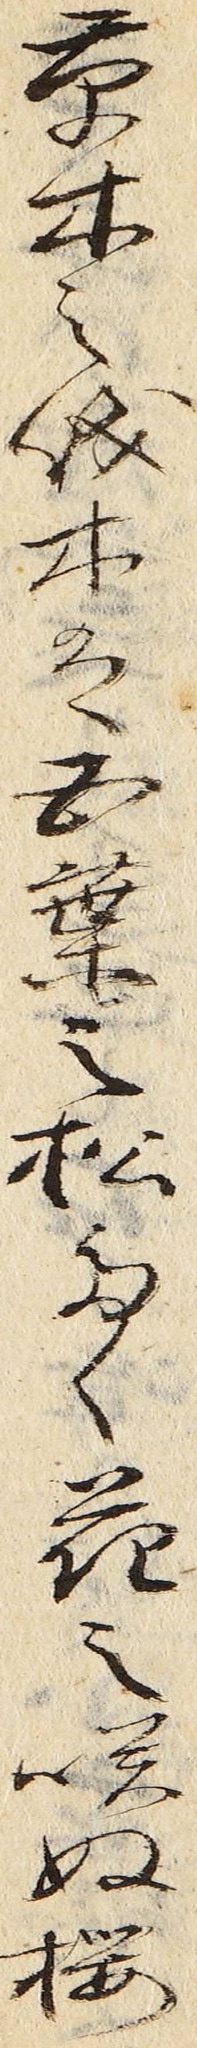草木之儀木は五葉之松多く花之咲ぬ桜
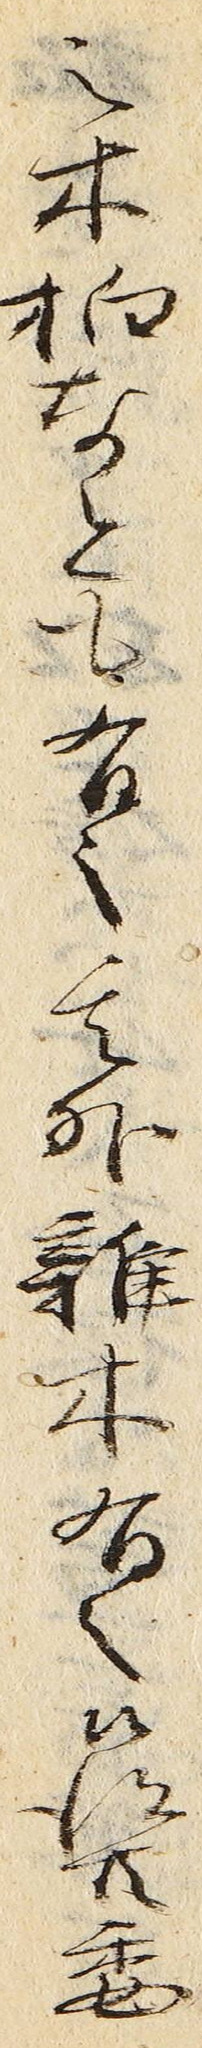之木柏なとも有之其外雑木有之候得共委
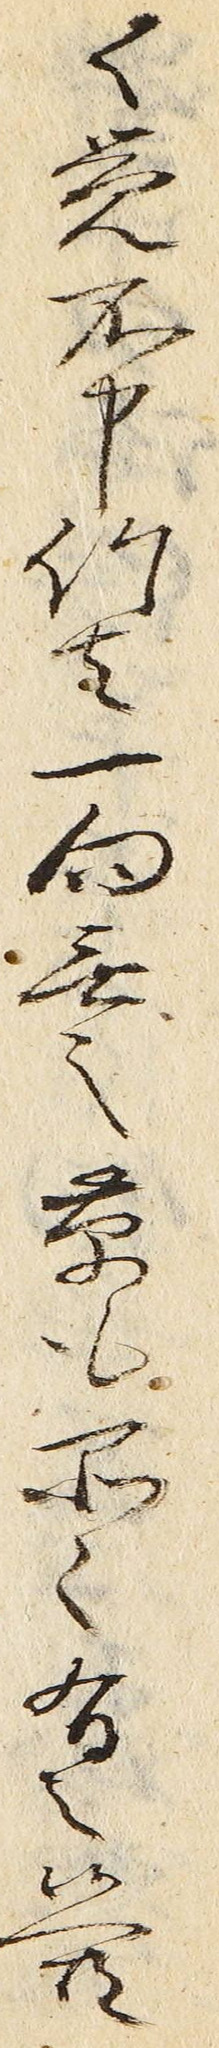く覚不申竹は一向無之草も品々有之候へ共
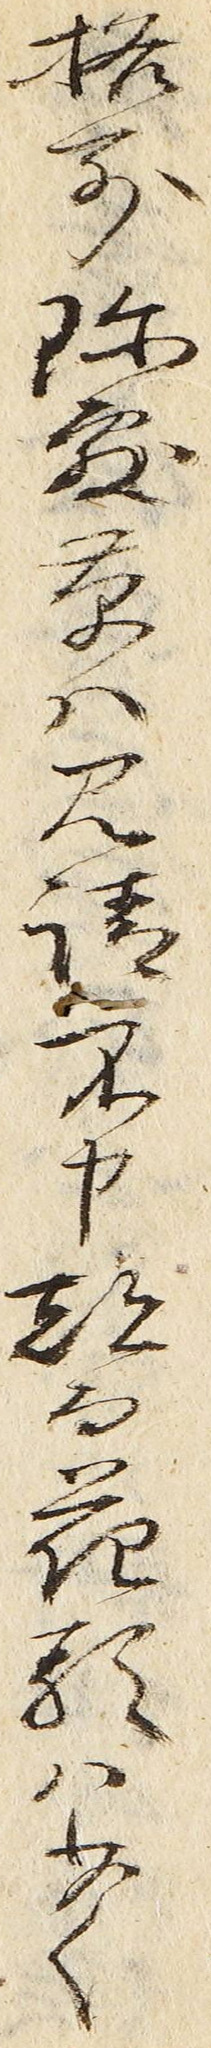格別珍敷草は見請不申都て花類は少く
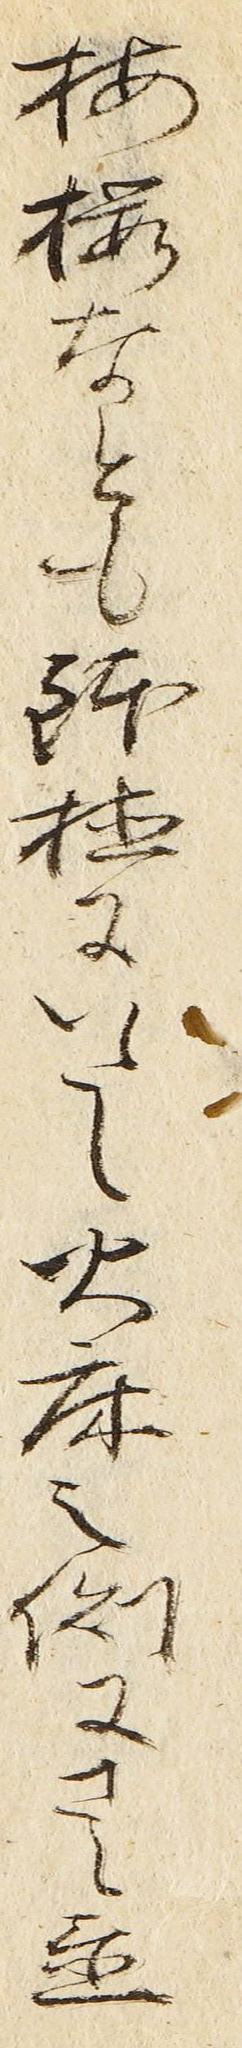梅桜なとも鉢植にいたし火床之側にさし置
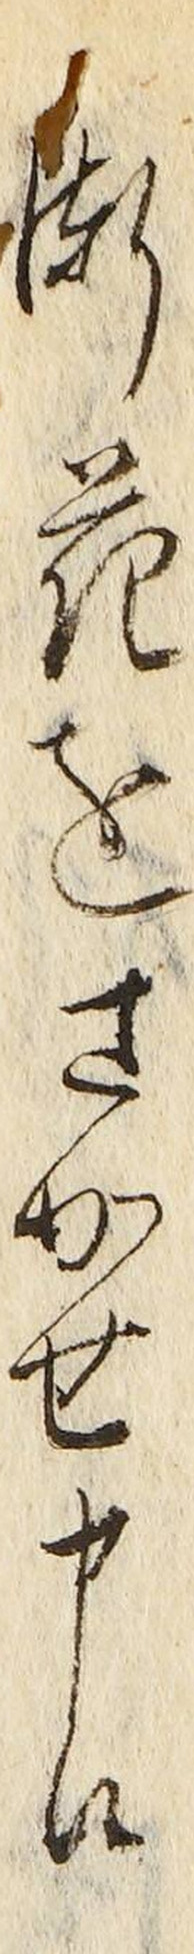漸花をさかせ申候
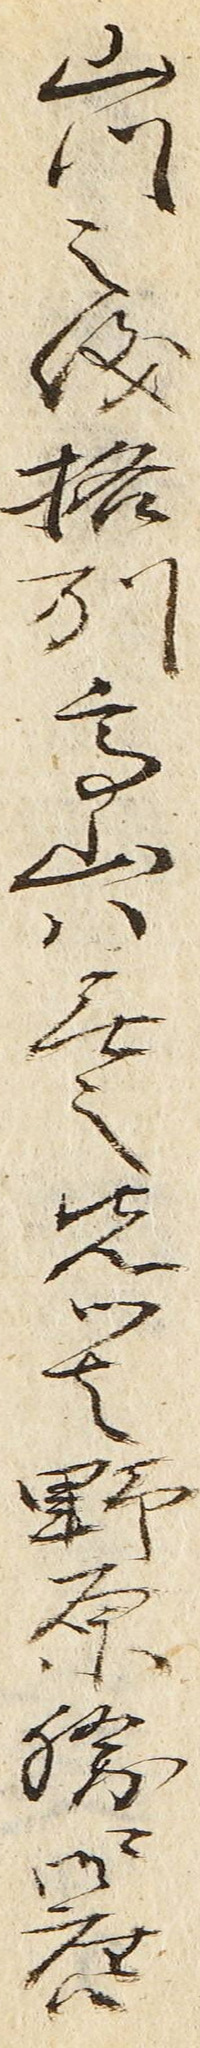山川之儀格別高山は無之先ッは野原勝に御座候
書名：漂民後記
